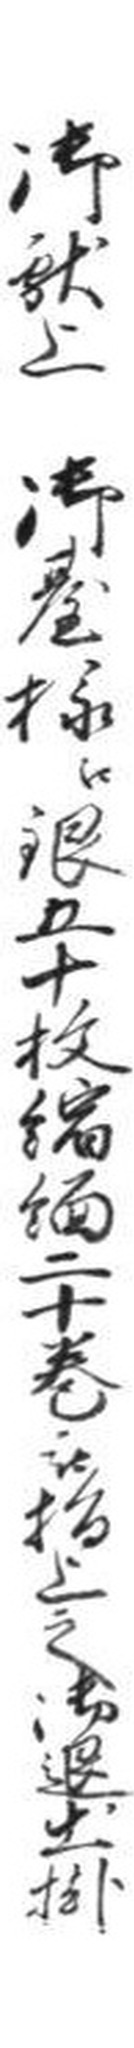御献上御台様江銀五十枚縮緬二十巻被指上之御退出掛
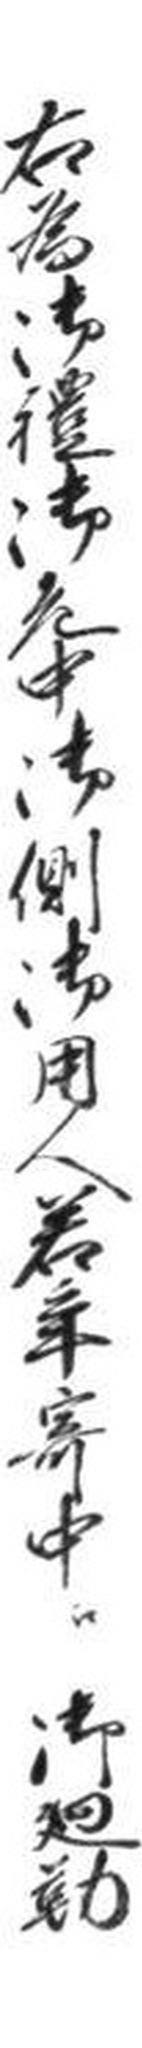右為御礼御老中御側御用人若年寄中江御廻勤
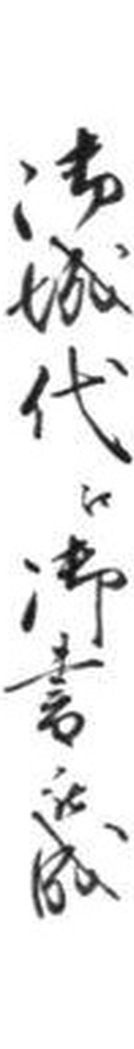御城代江御書被成
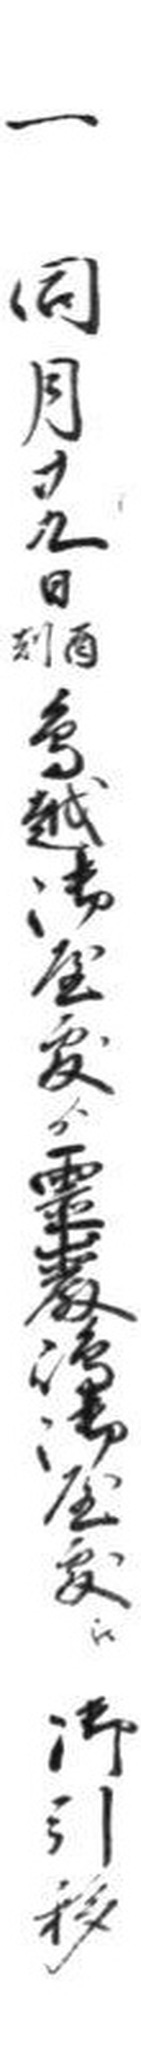一同月廿九日酉刻鳥越御屋敷ゟ霊岸島御屋敷江御引移
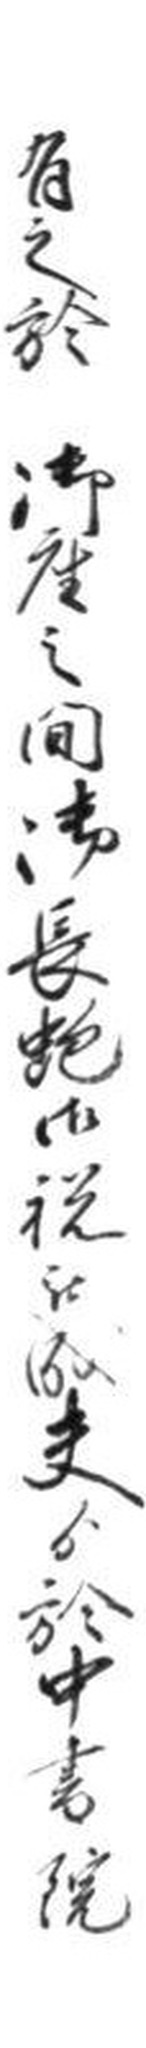有之於御座之間御長蚫御祝被成夫ゟ於中書院
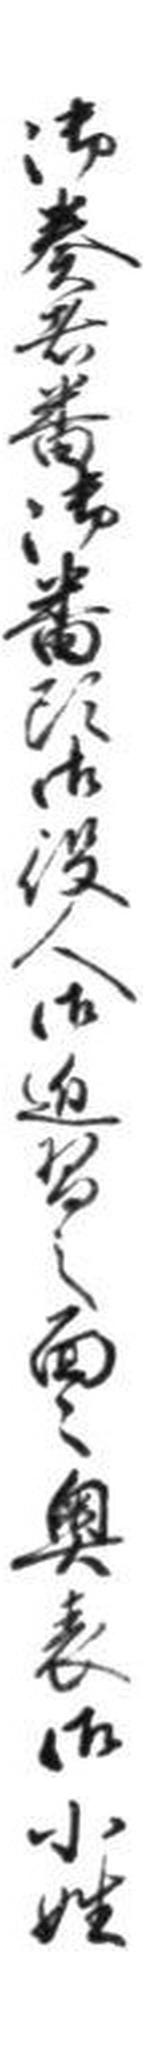御奏者番御番頭御役人御近習之面々奥表御小姓
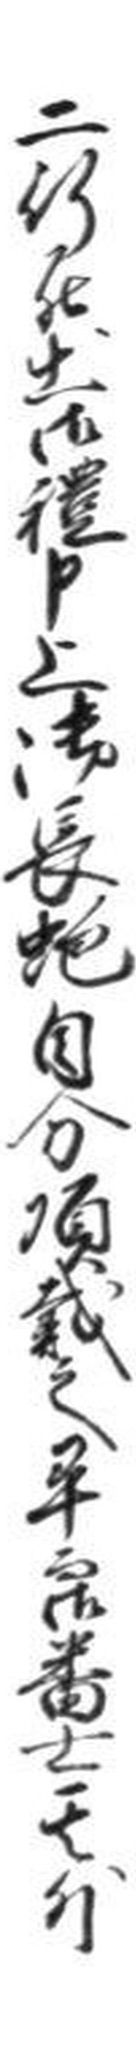二行罷出御礼申上御長蚫自分頂戴之畢而御番士其外
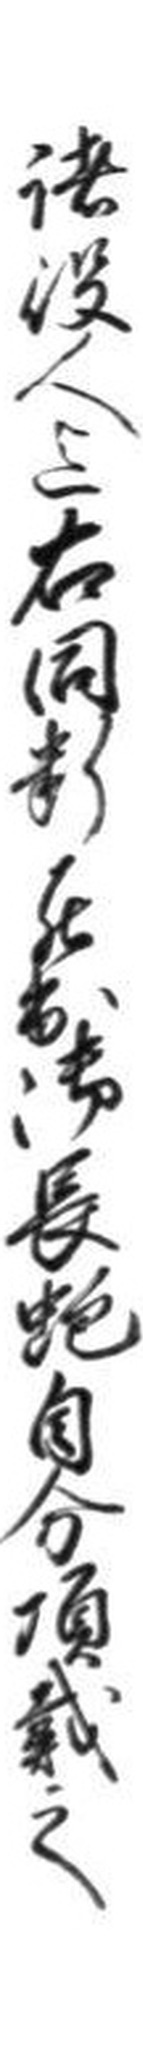諸役人迄右同断罷出御長蚫自分頂戴之
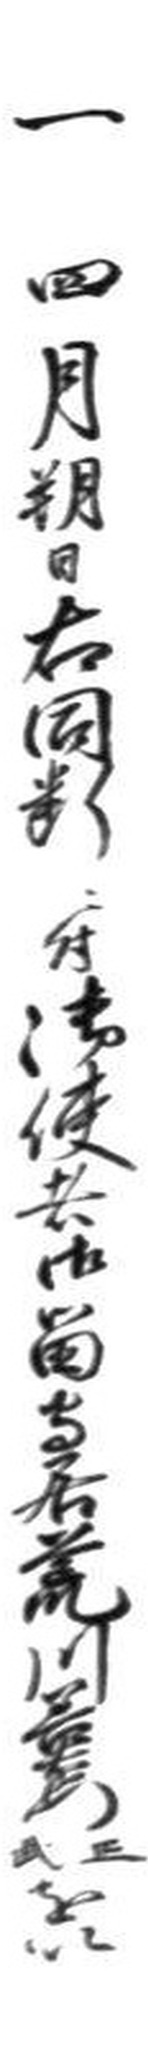一四月遡日右同断ニ付御使者御留守居荒川善右衛門正武を以
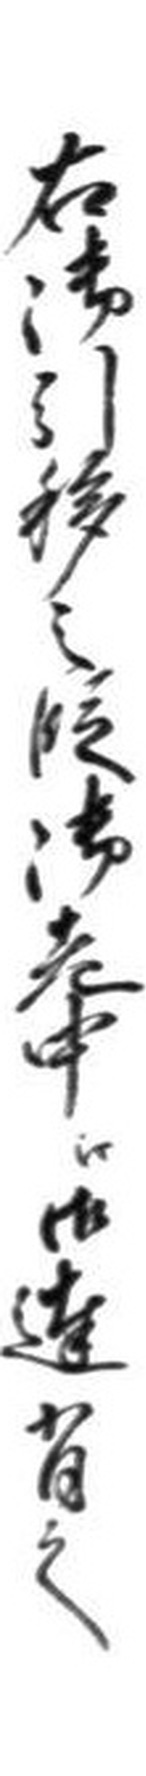右御引移之段御老中江御達有之
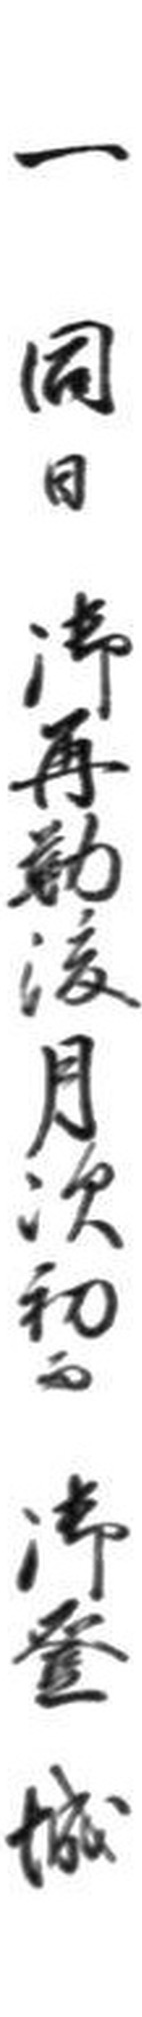一同日御再勤後月次初而御登城
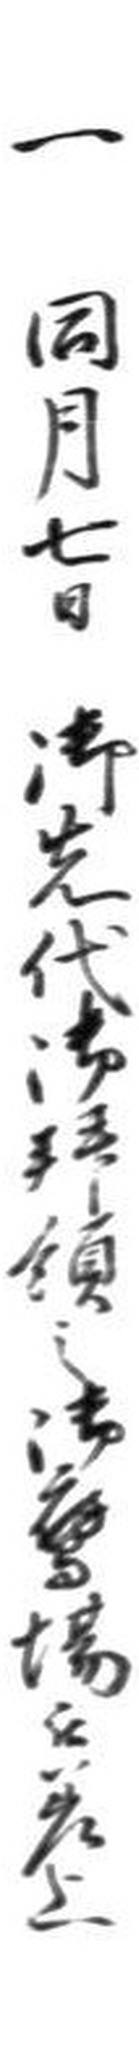一同月七日御先代御拝領之御鷹場被差上
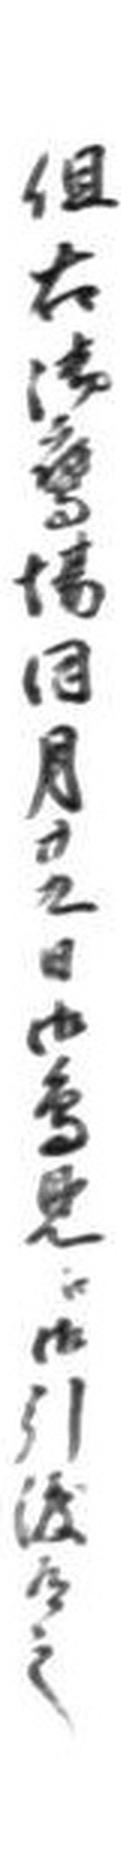但右御鷹場同月廿九日御鳥見江御引渡有之
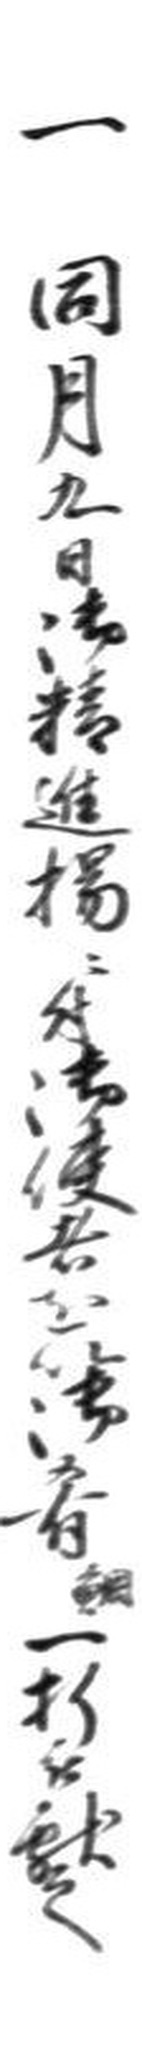一同月九日御精進揚ニ付御使者を以御肴鯛一折被献之

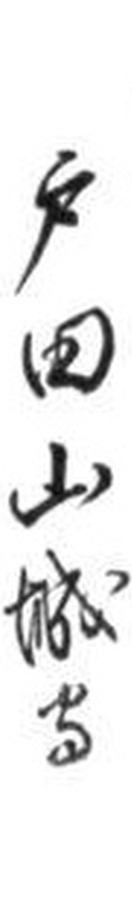戸田山城守
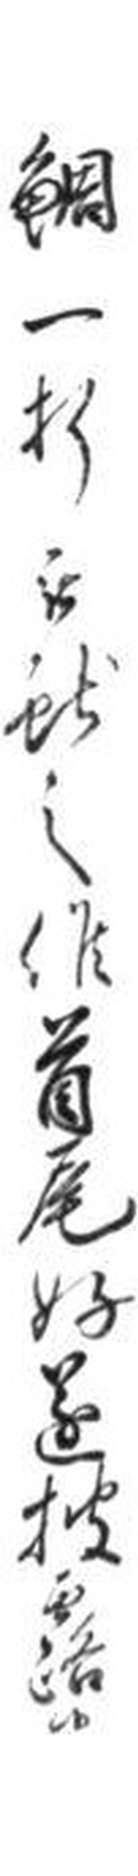鯛一折被献之候主首尾好遂披露候
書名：家譜 十六 吉品公 従貞享三年閏三月到同四年
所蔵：福井県文書館 Fukui Prefectural Archives
